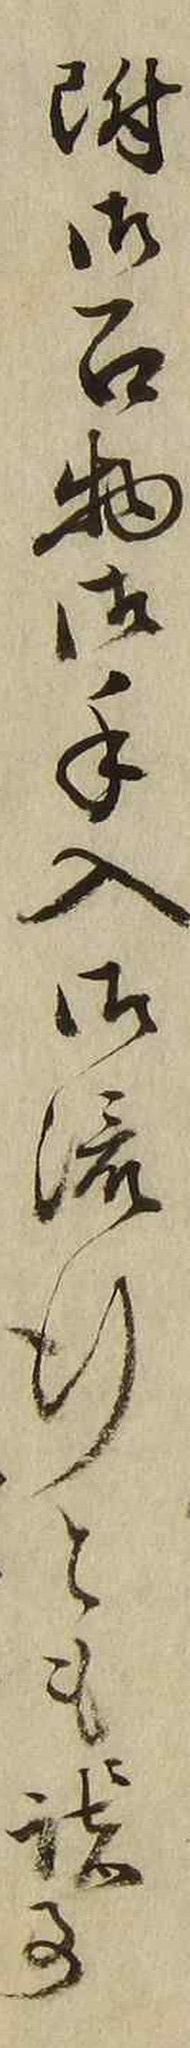附御召物御手入御流行ともニ諸事
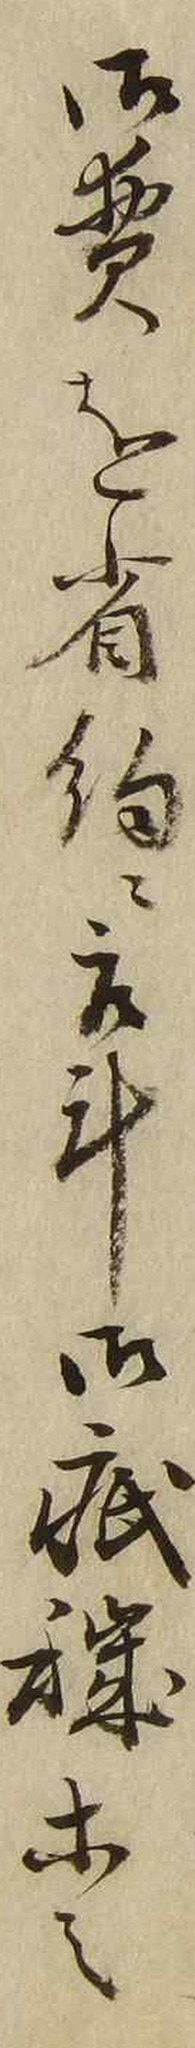御費を省約ニ取計御疵穢等之

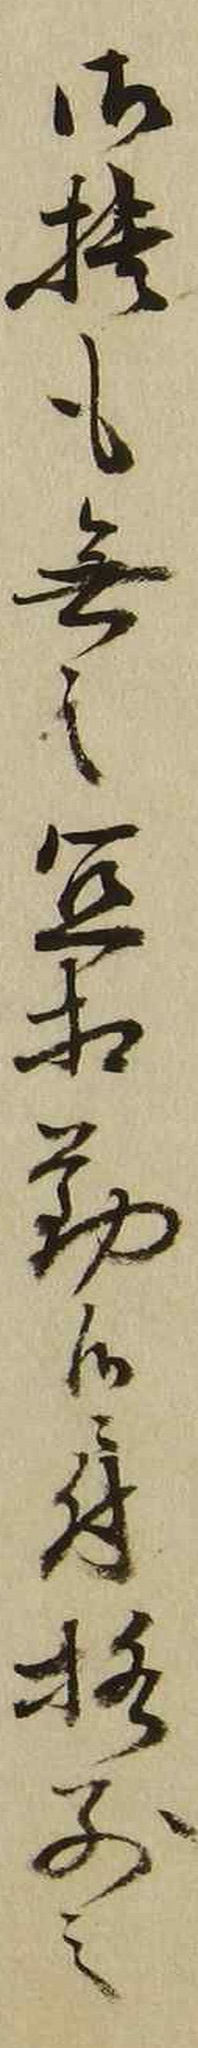御捨も無之宜相勤候ニ付格別之
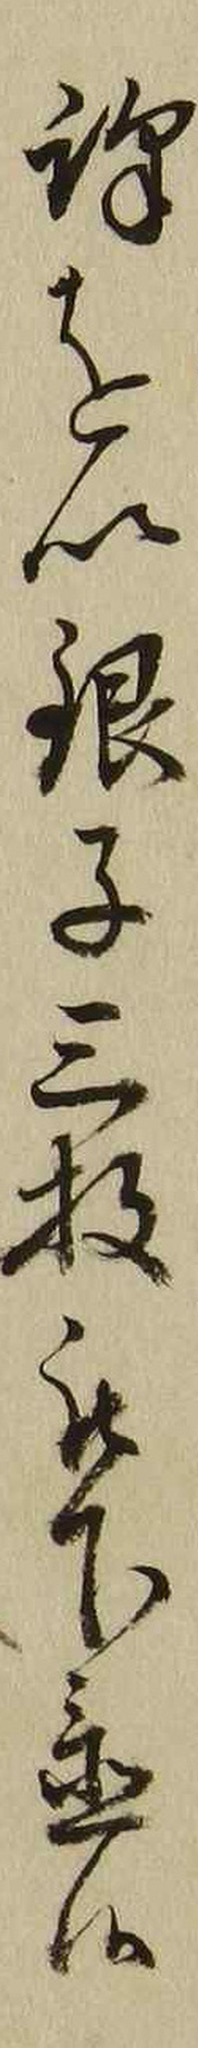訳を以銀子三枚被下置候
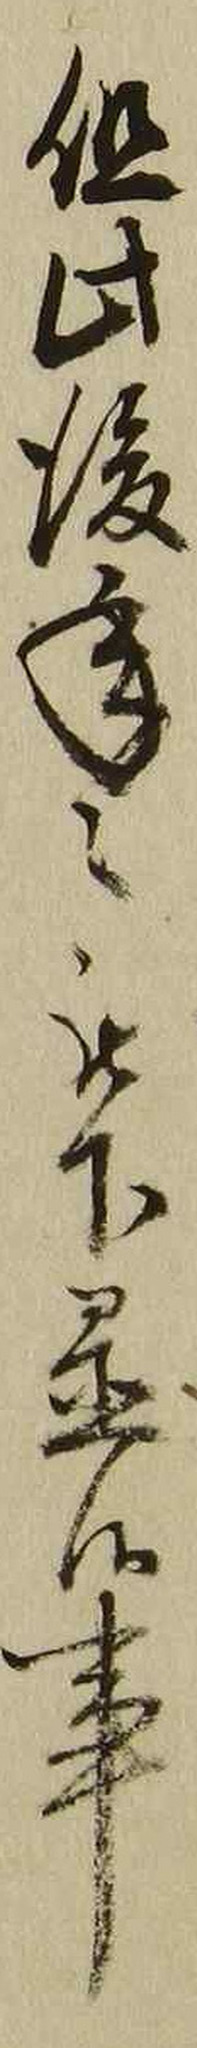但此後年々被下置候事
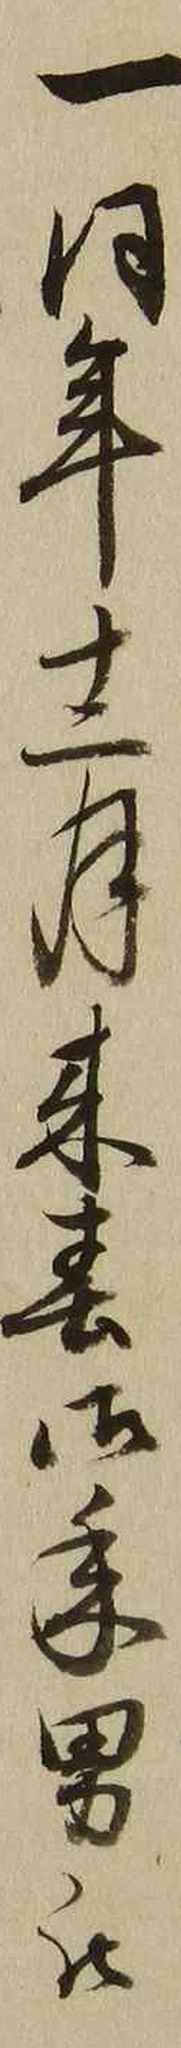一同年十二月来春御年男被
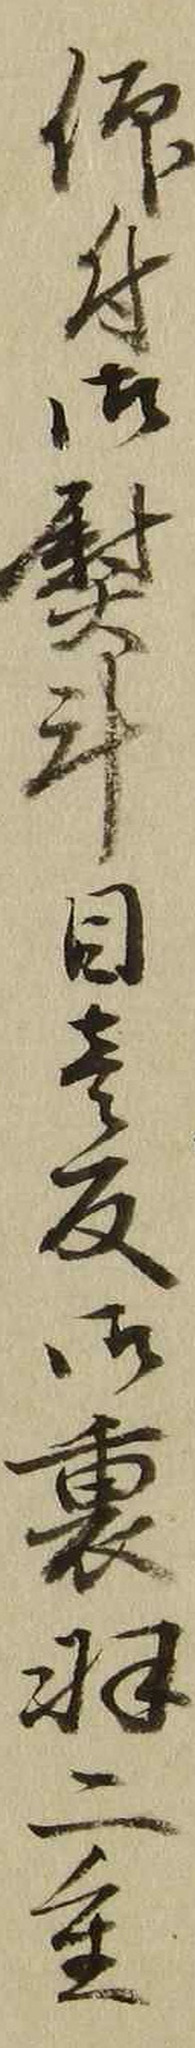仰付御熨斗目壱反御裏羽二重
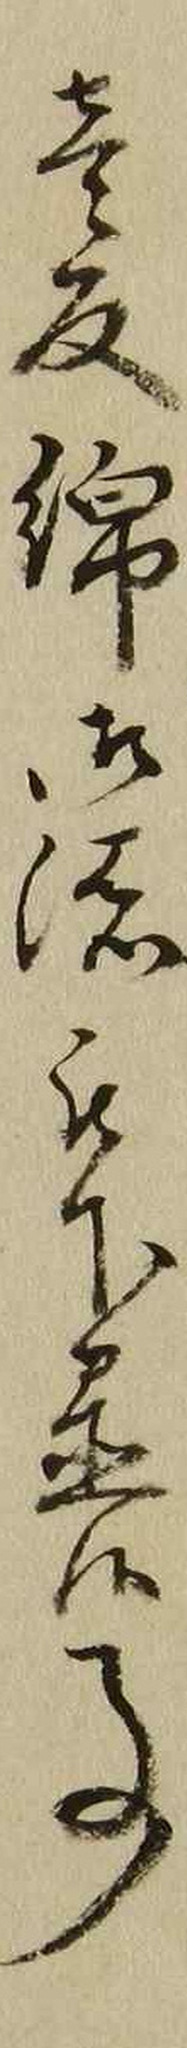壱反綿御添被下置候事
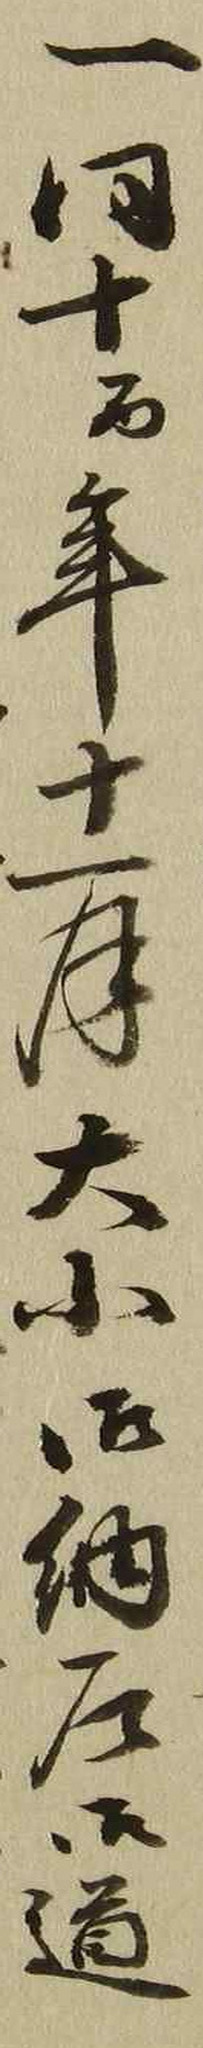一同十酉年十一月大小御納石御道
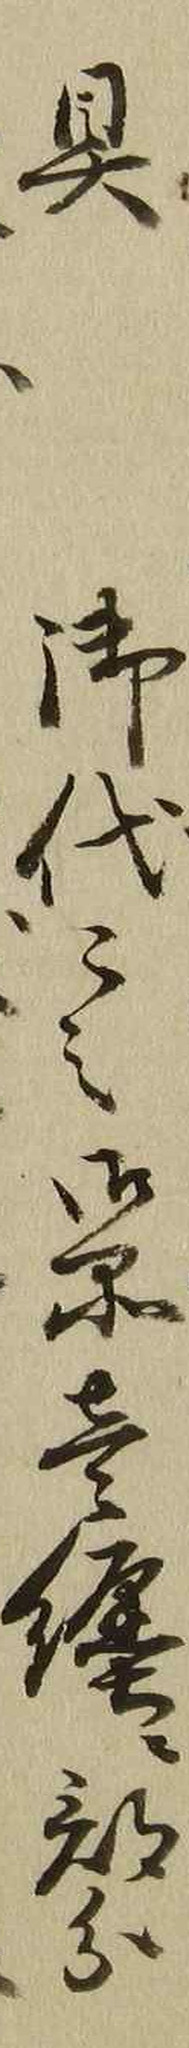具御代々之御品壱纏ニ部分
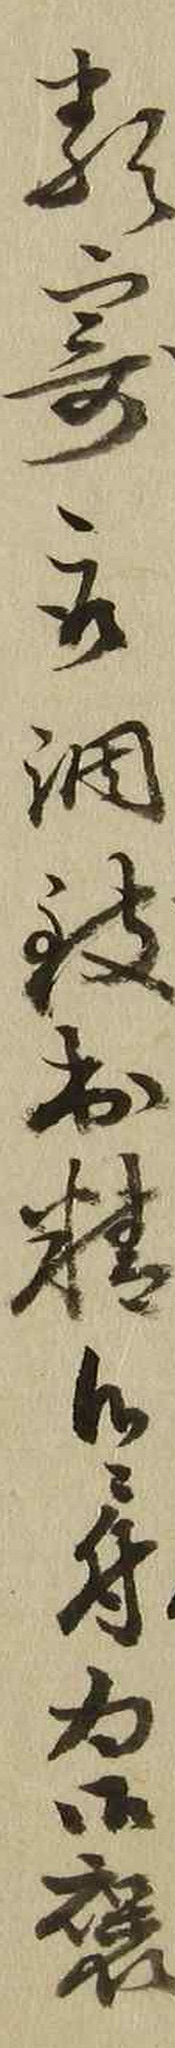類寄取調致出精候ニ付為御褒
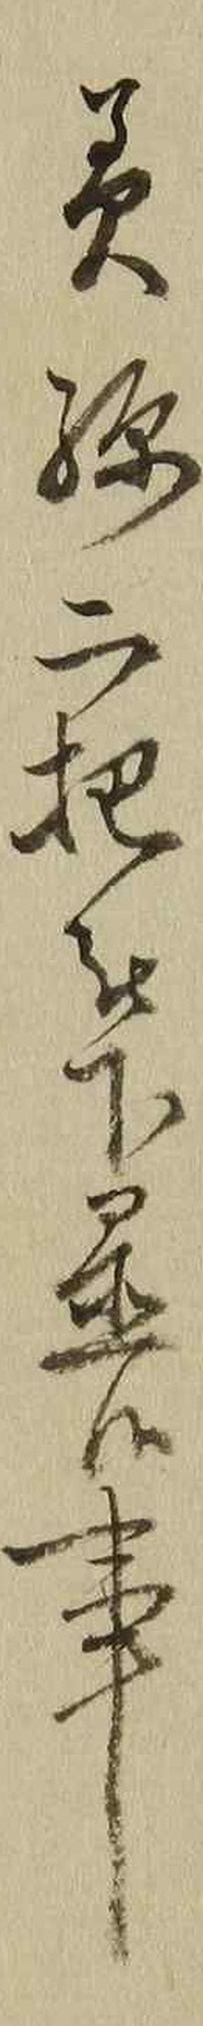美綿二把被下置候事
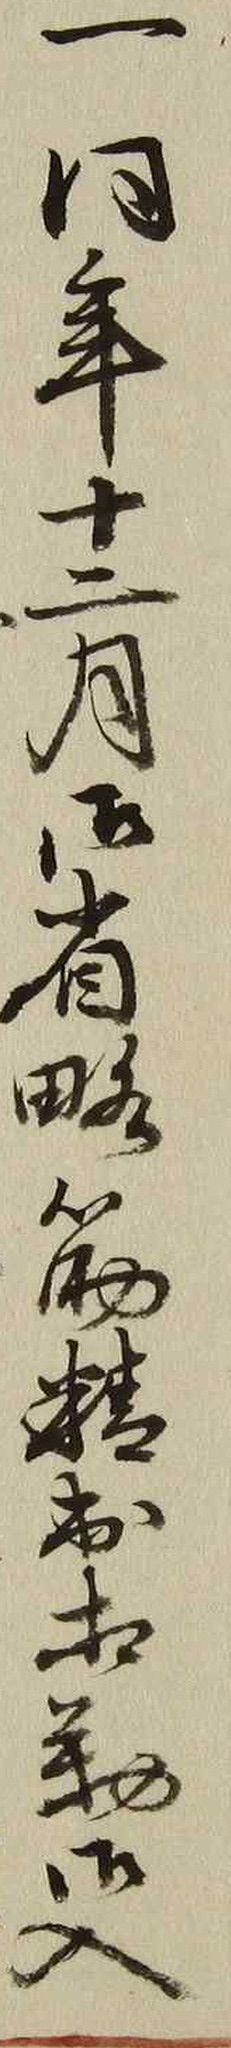一同年十二月御者略筋精出相勤御入
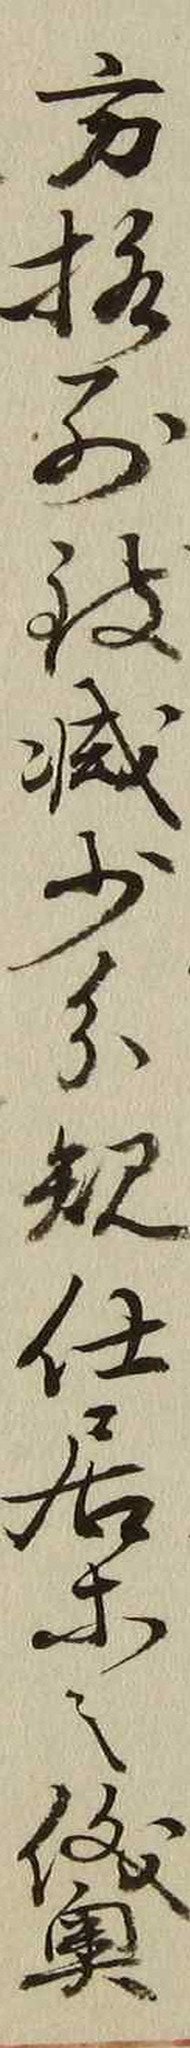方格別致減少分規仕居等之儀奥
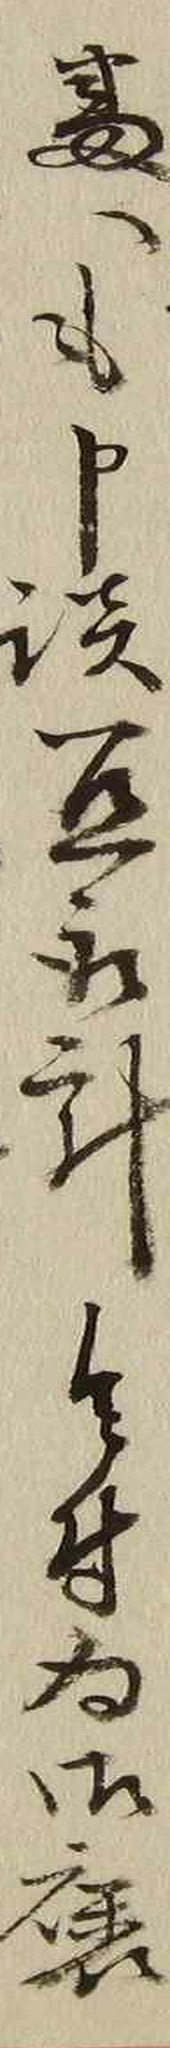番へも申談宜取計候ニ付為御褒
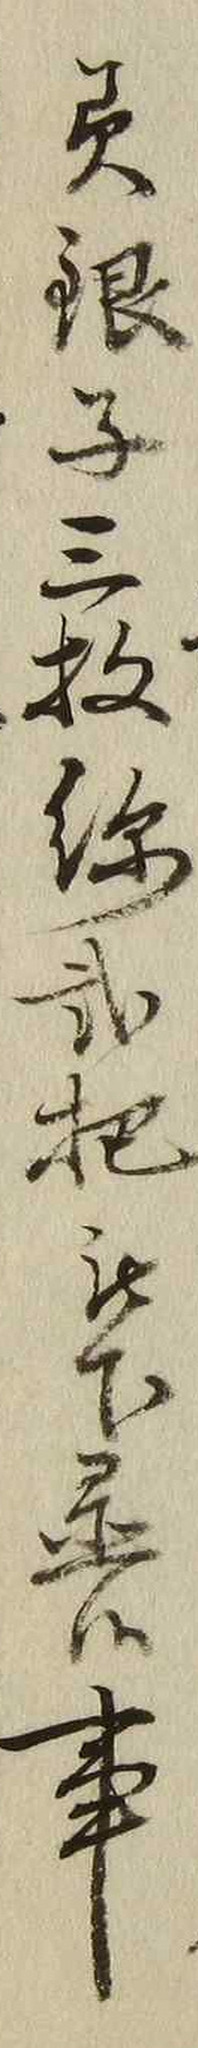美銀子三枚綿弐把被下置候事
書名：諸士系譜　巻之35　は之部3
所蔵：会津若松市立会津図書館
